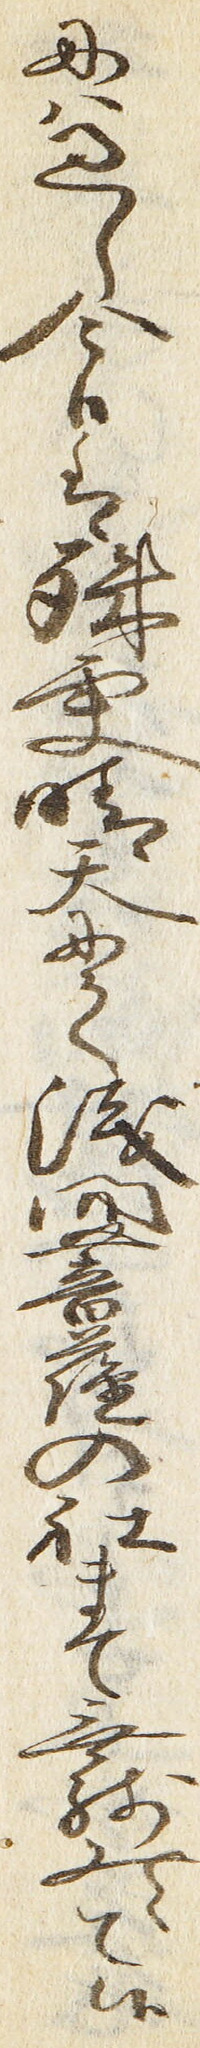には過し今日は殊更晴天にて浅間菩薩の社まて無残みえて候
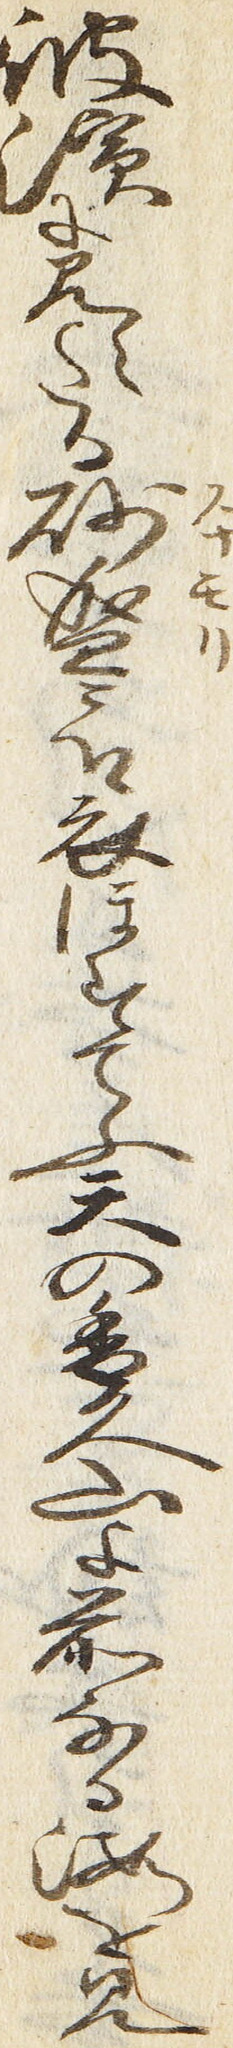彼浜に見えたる砂盛こそ衣ほすてふ天の香久山よ前なる海を見
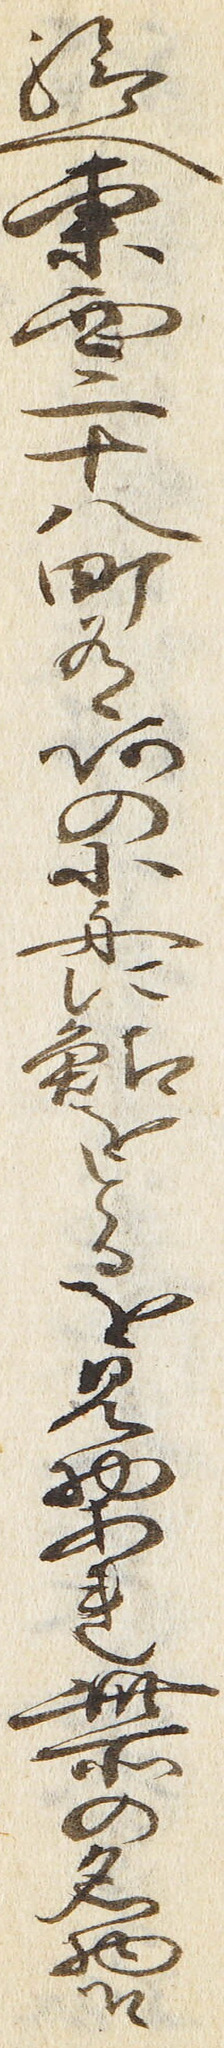給へ東西二十八町有あの小舟に鮎をとるを見物あれ此所の名物そ
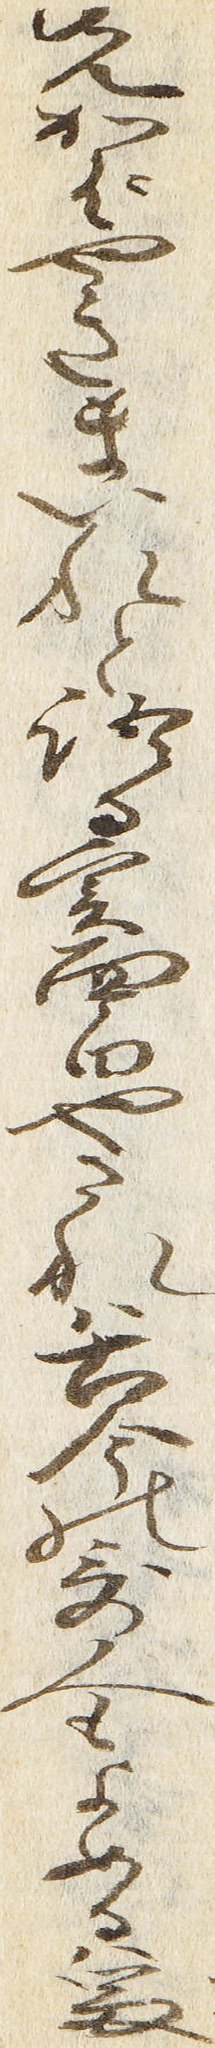先かばやきまいれと語る実面白やされは古今の歌人もよめるは富
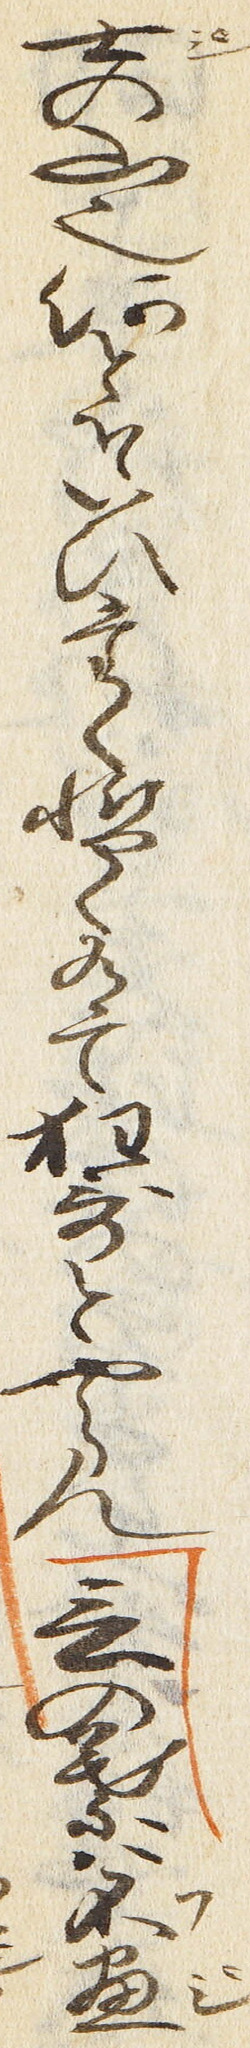士の山也何とそいひたく暫く有て狂歌とやらん「言の葉は不尽
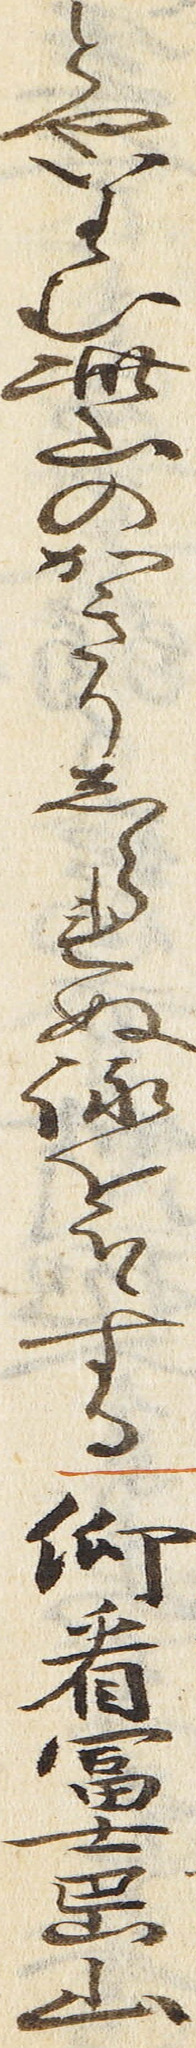とやいはむ此山のかきりしられぬ詠をそする「仰看富士
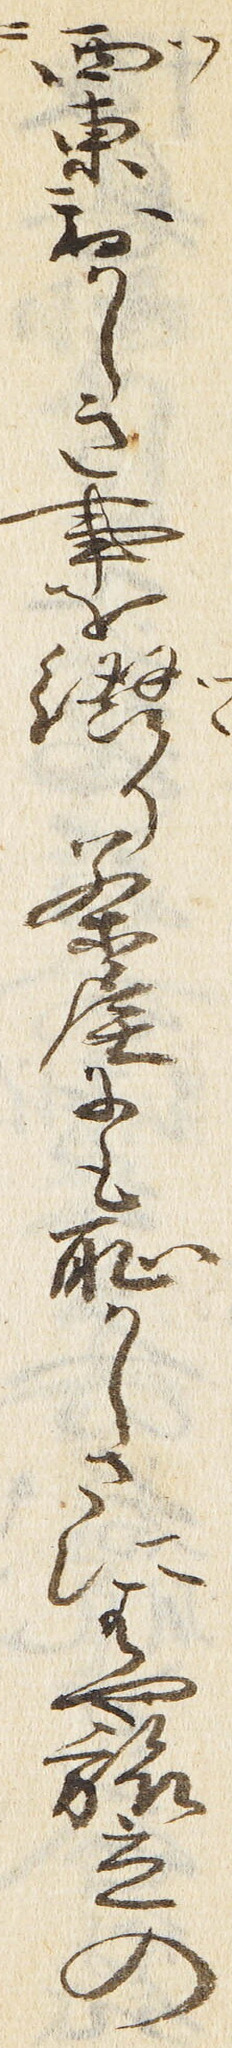ツ東おかしき事を綴り茶屋にも恥かしさにはや旅立の
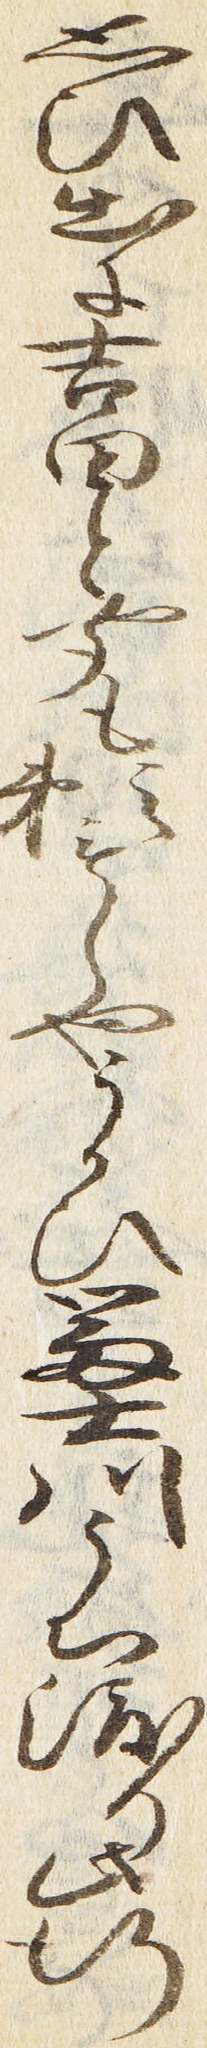思ひ出に吉田と聞も頼もしやうかひ富士川うち渡り此行
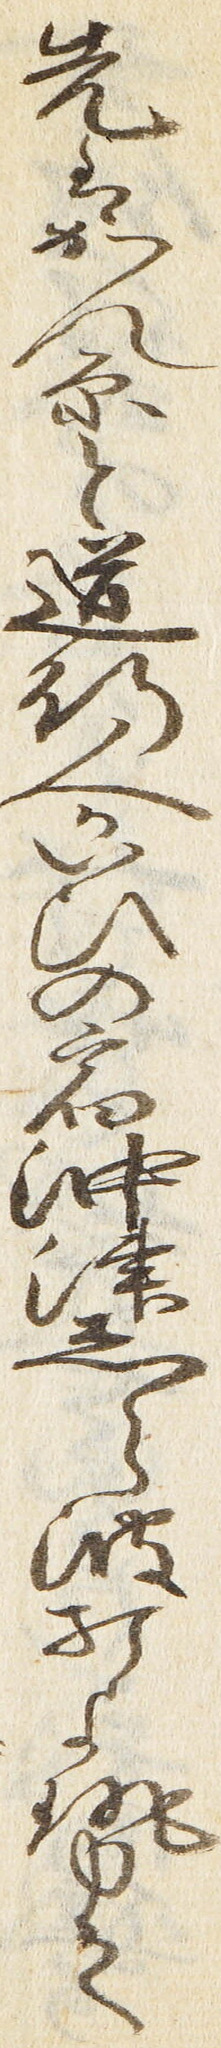先はかん原と道行人かいひの宿沖津しら波打よせて
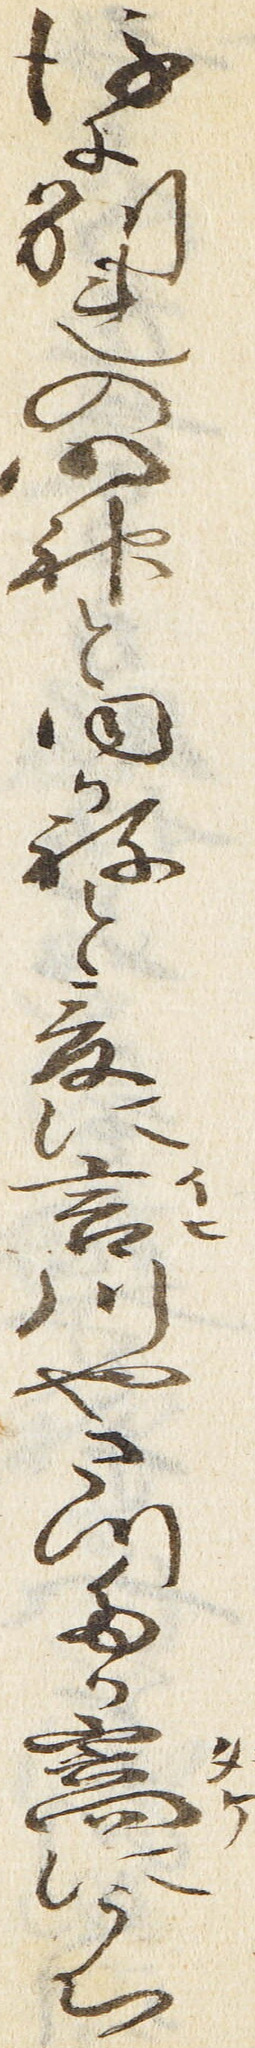後に別れの明神とかねと爰に言川やさつたか嵩にうち
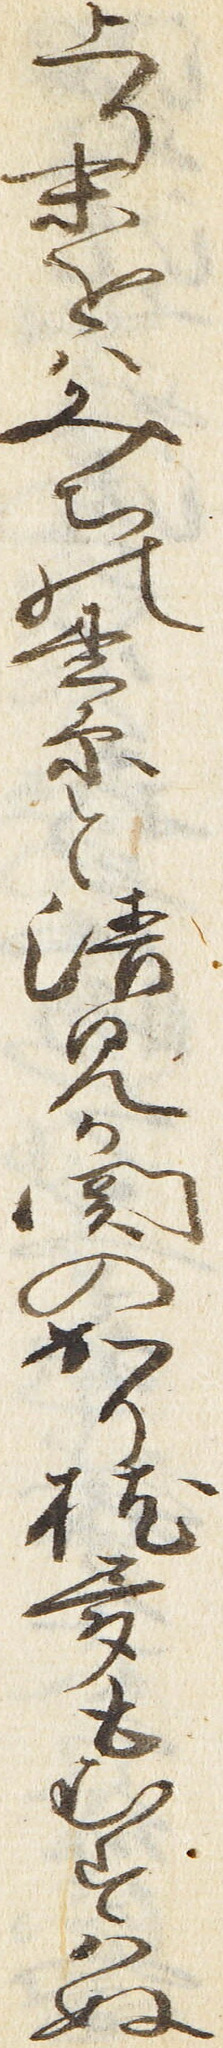上り末をはみちの野原と清見か関のかり枕夢もむすはぬ
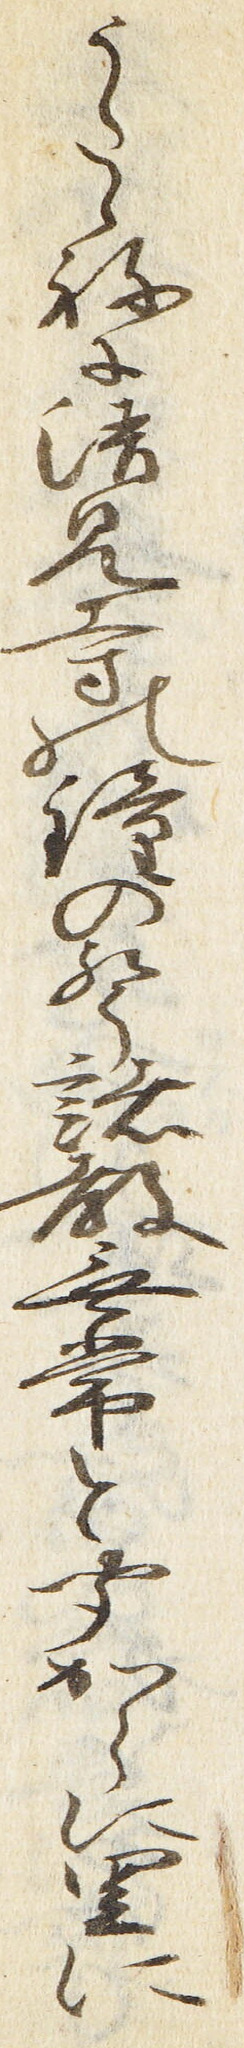うたゝねに清見寺の鐘の声諸教無常と聞からに里に
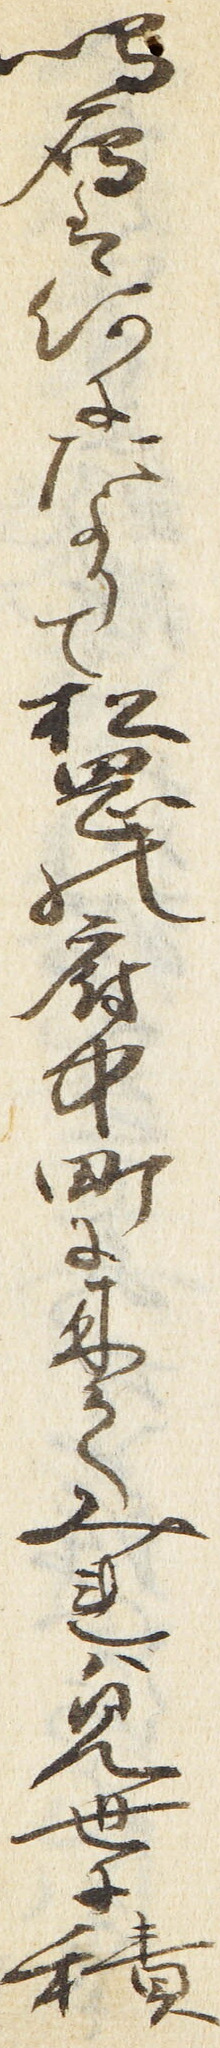鳴鳫は何にたよりて松岡の府中町に来てみれは見世に積
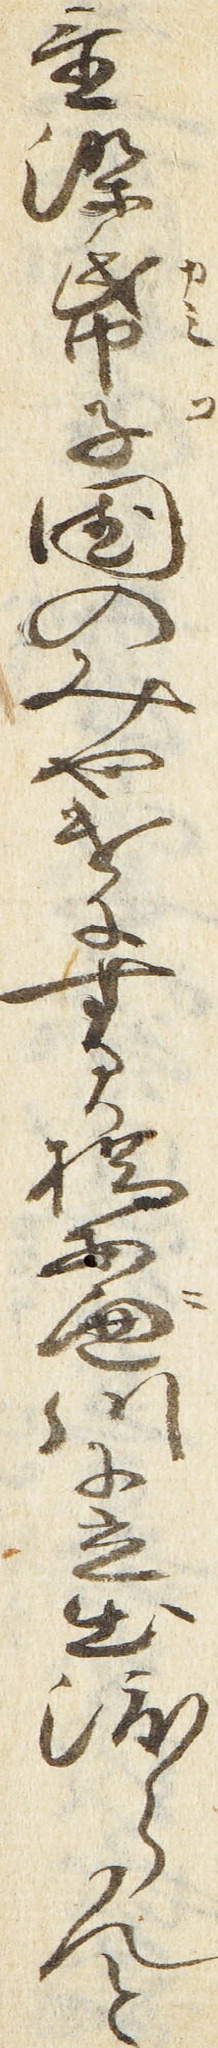置染紙子国のみやけにするか橋あべ川に立出渡らんと

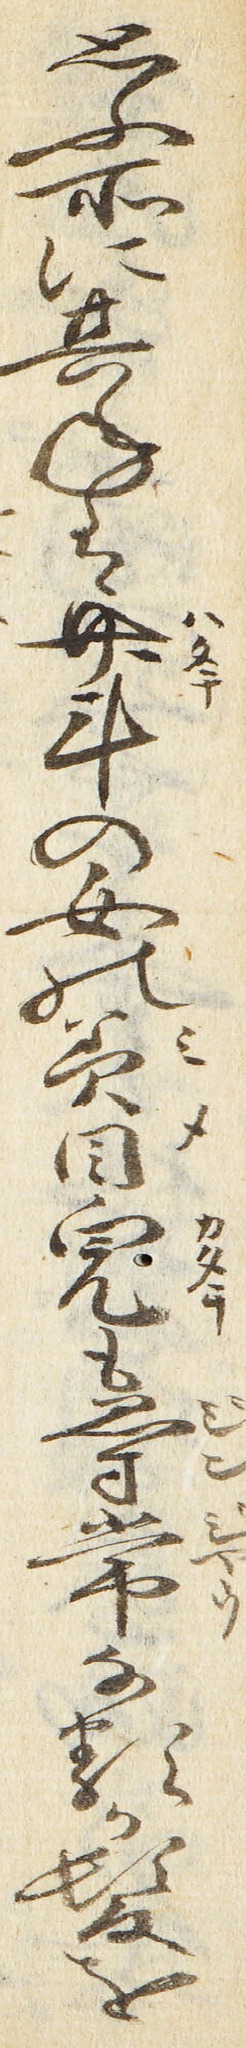思ふ所に其年は廿計の女の美目皃も常尋なるか髪を
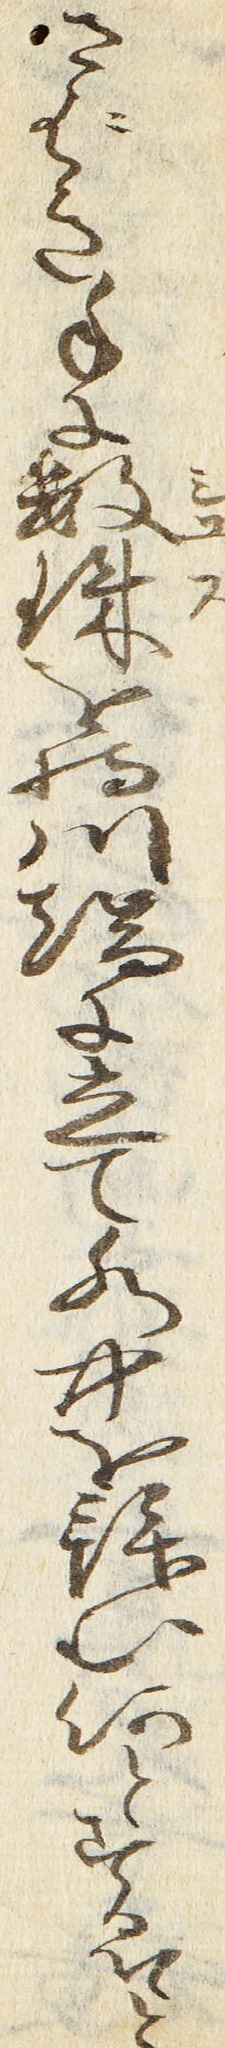さばき手に数珠を持川端に立て水中を拝む何とするそと
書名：海陸世話日記
